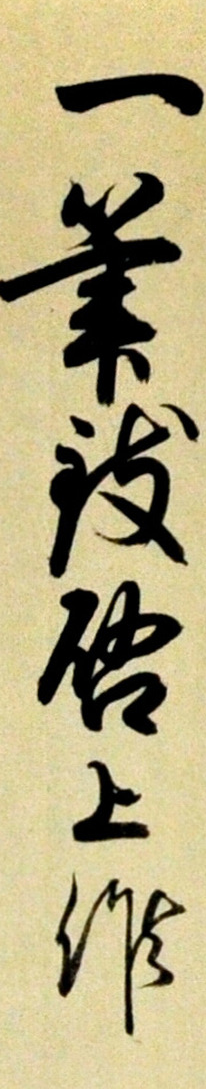一筆致啓上候
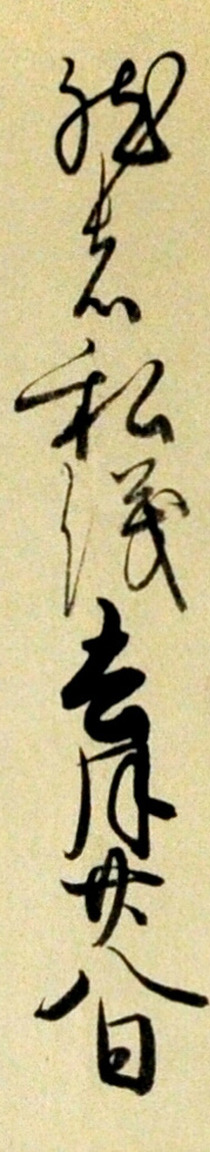然者私儀去月廿八日
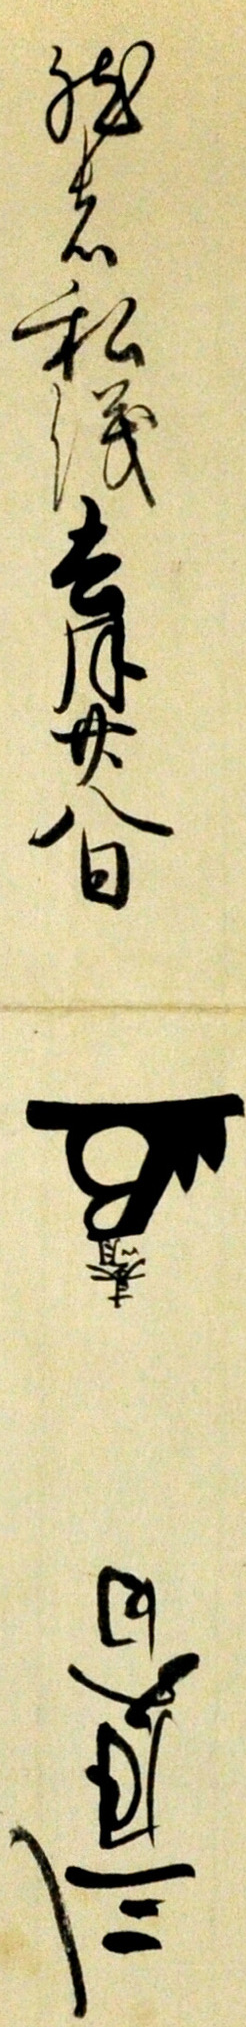然者私儀去月廿八日
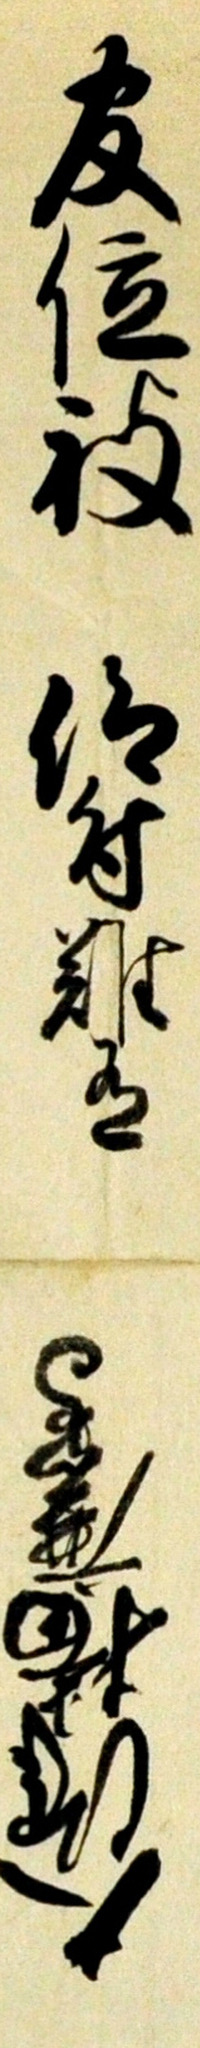官位被仰付難有
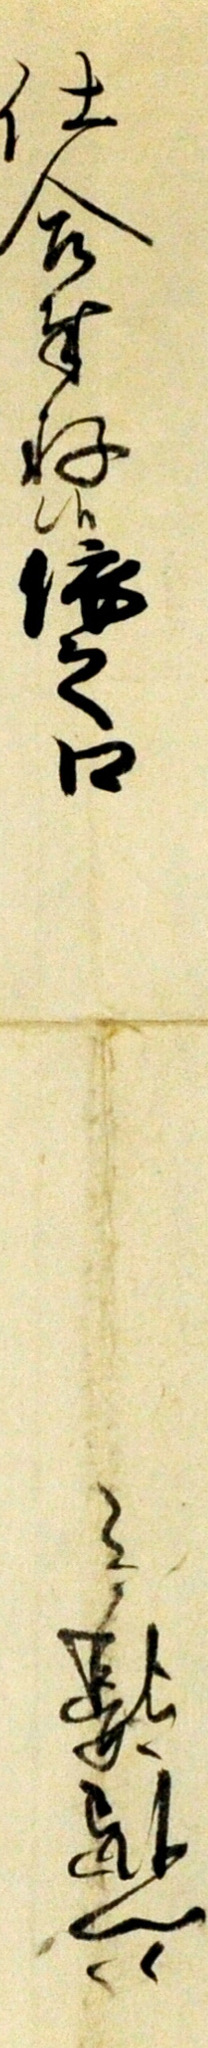仕合奉存候依之口
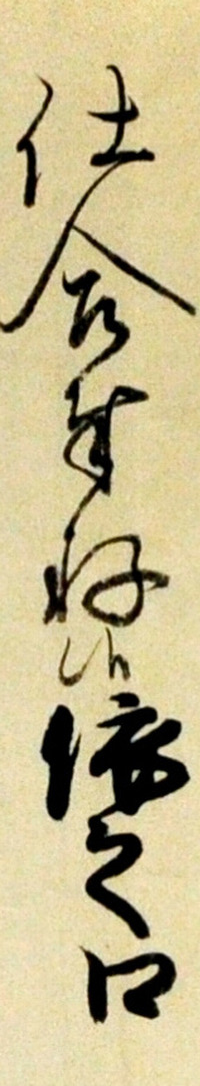仕合奉存候依之口
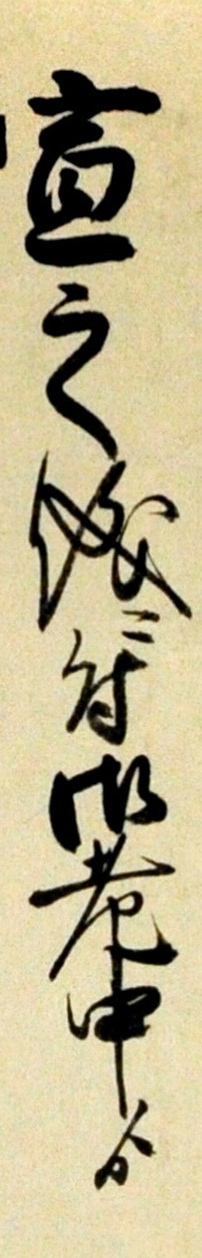宣之儀ニ付御老中ゟ
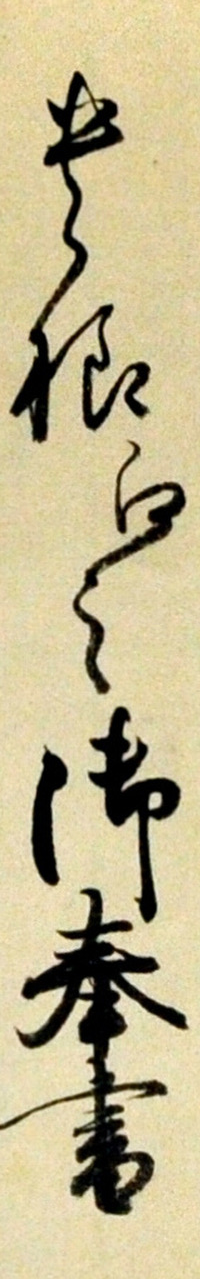貴様江之御奉書
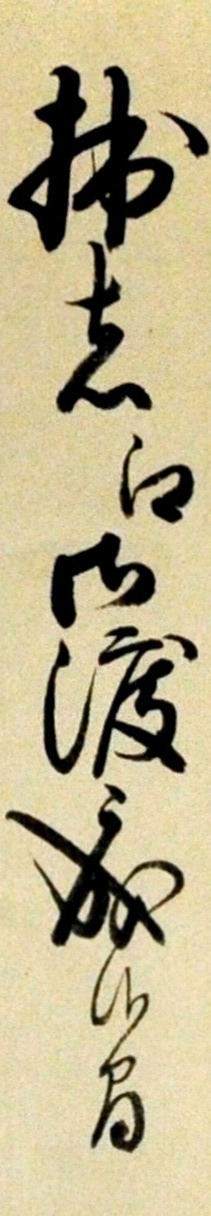拙者江御渡被成候間
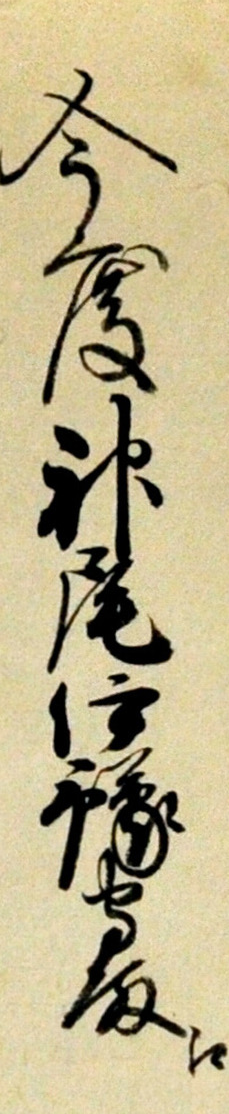今度神尾伊予守殿江
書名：書状
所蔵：伊那市立高遠町図書館・合同会社AMANE
